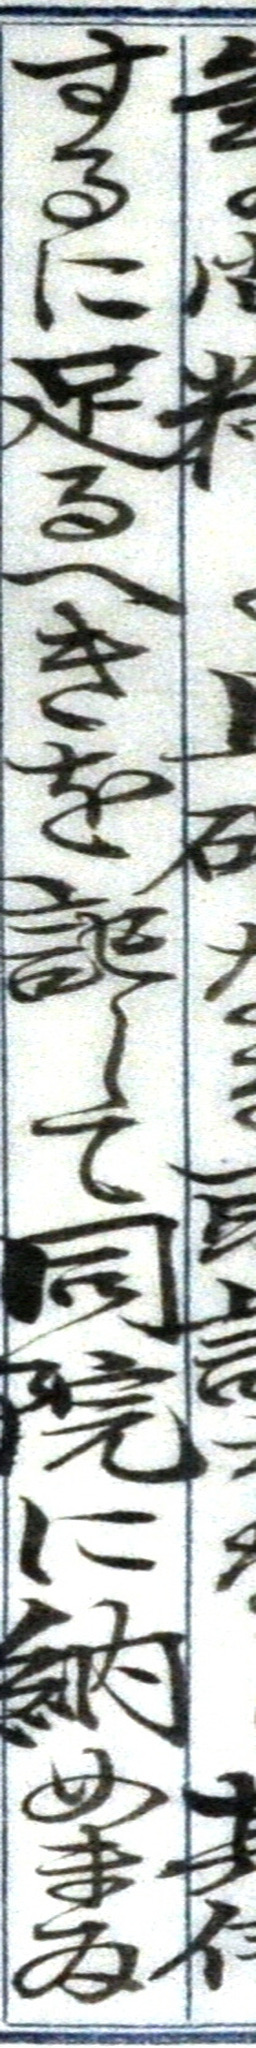するに足るへきを記して同院に納めまゐ
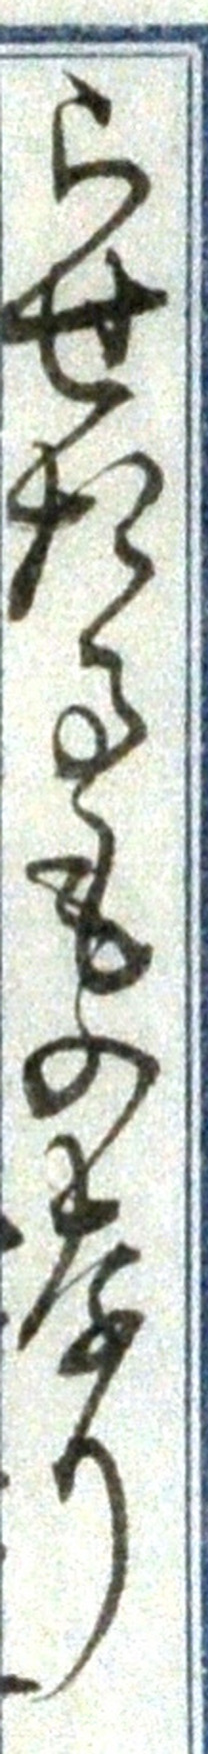らせたるものなり
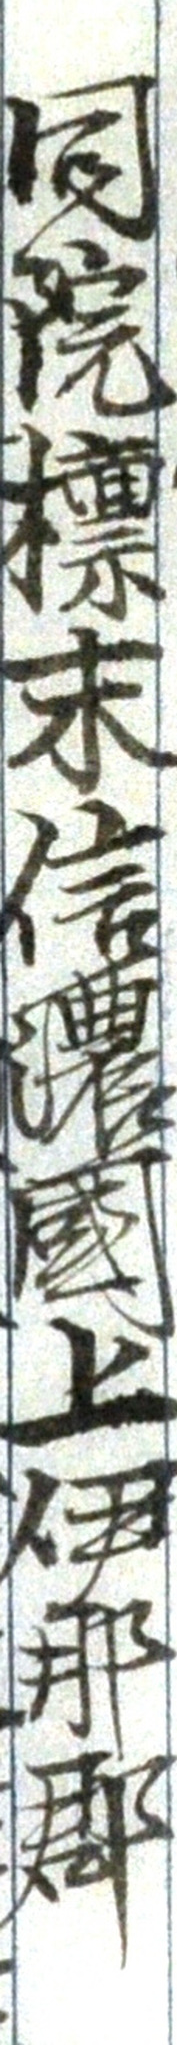同院檀末信濃国上伊那郡
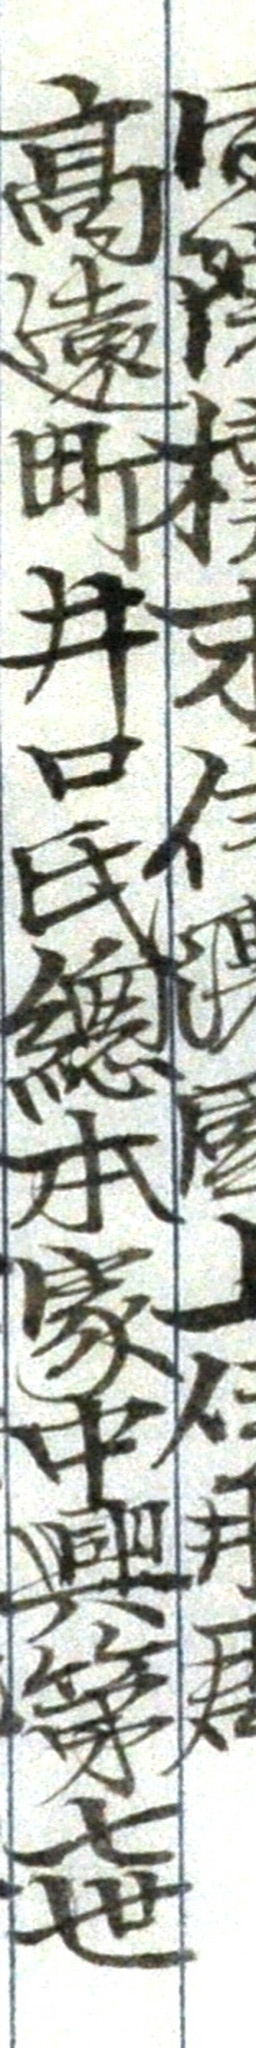高遠町井口氏総本家中興第七世
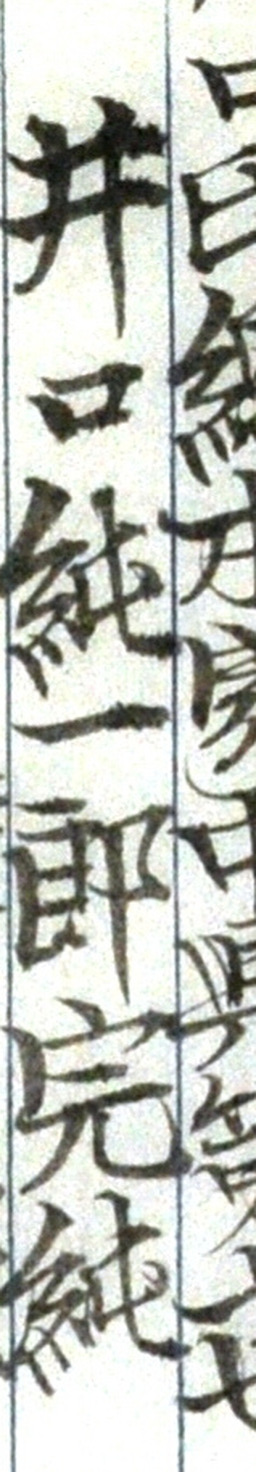井口純一郎完純
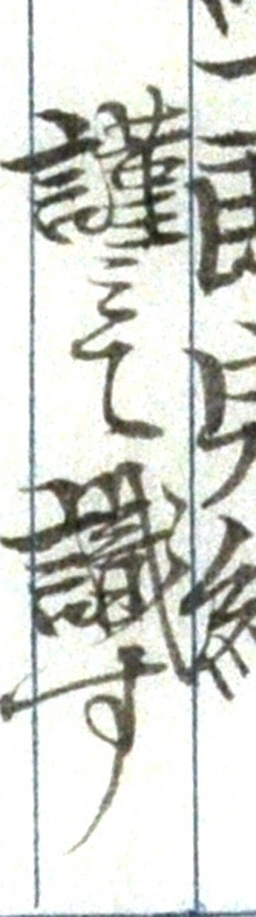謹ミて識す

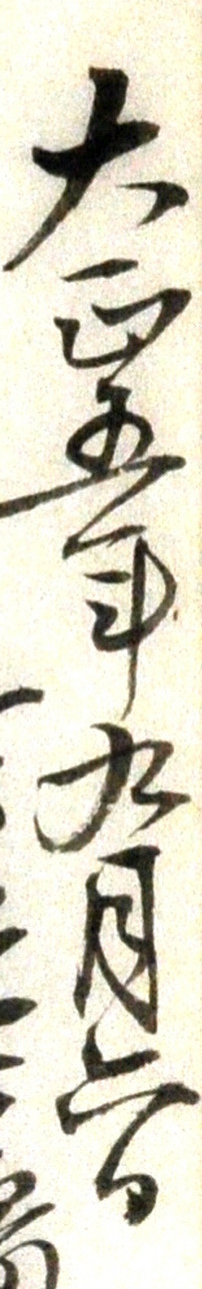大正五年九月六日
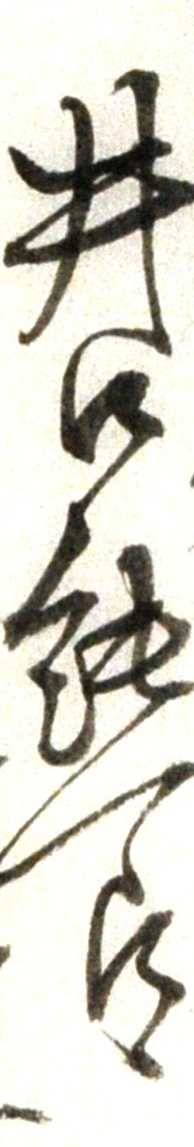井口純一郎

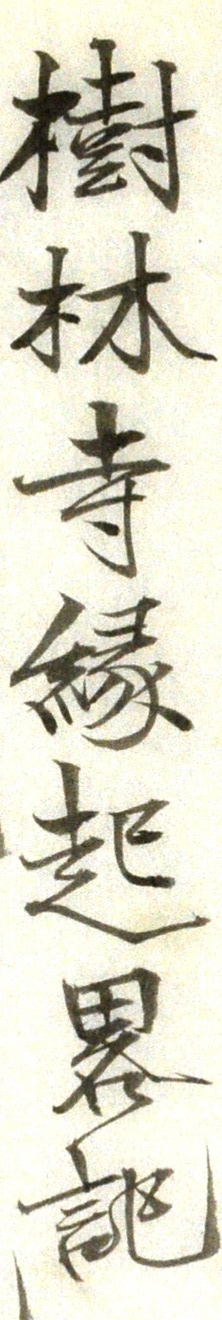樹林寺縁起略記
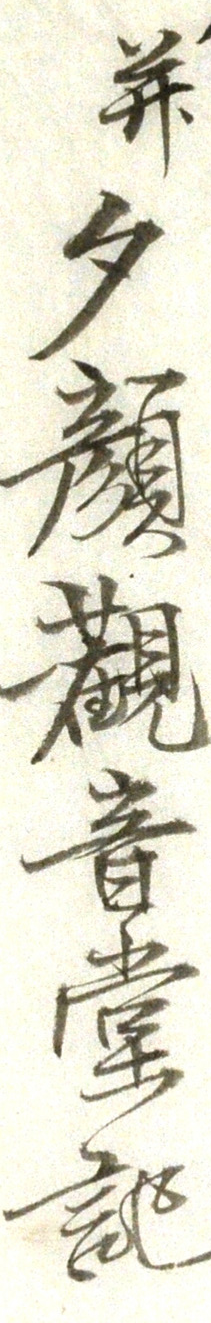并夕顔観音堂記
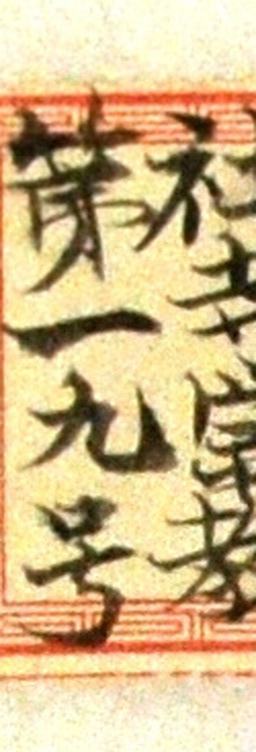第一九号
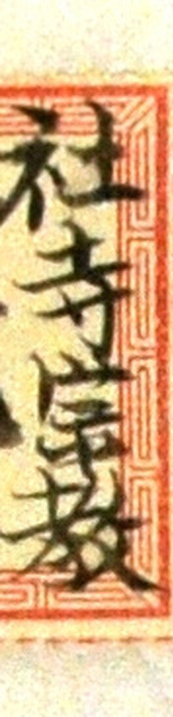社寺宗教

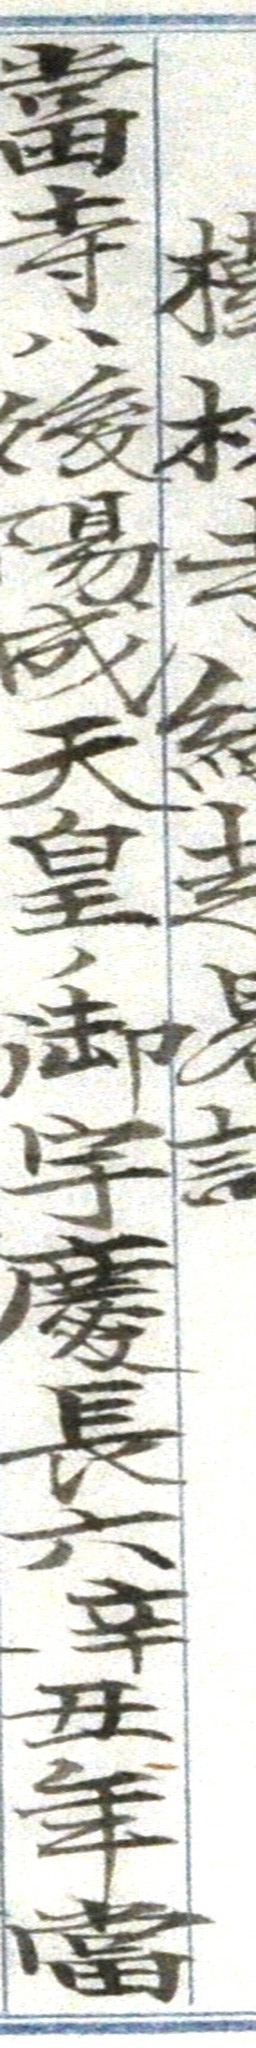当寺ハ後陽成天皇ノ御宇慶長六辛丑年当
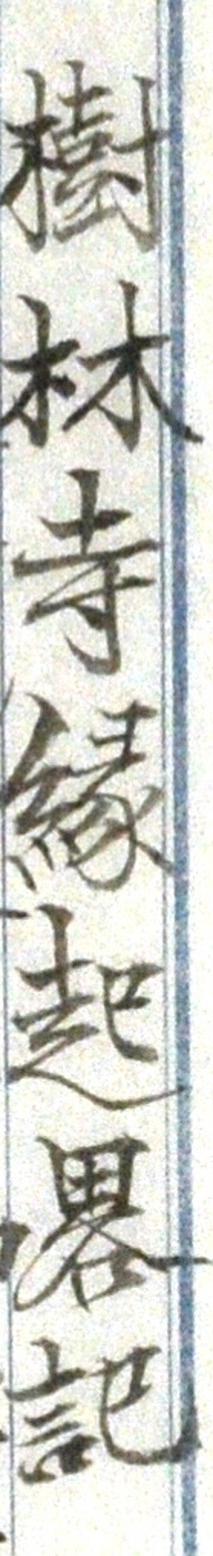樹林寺縁起略記
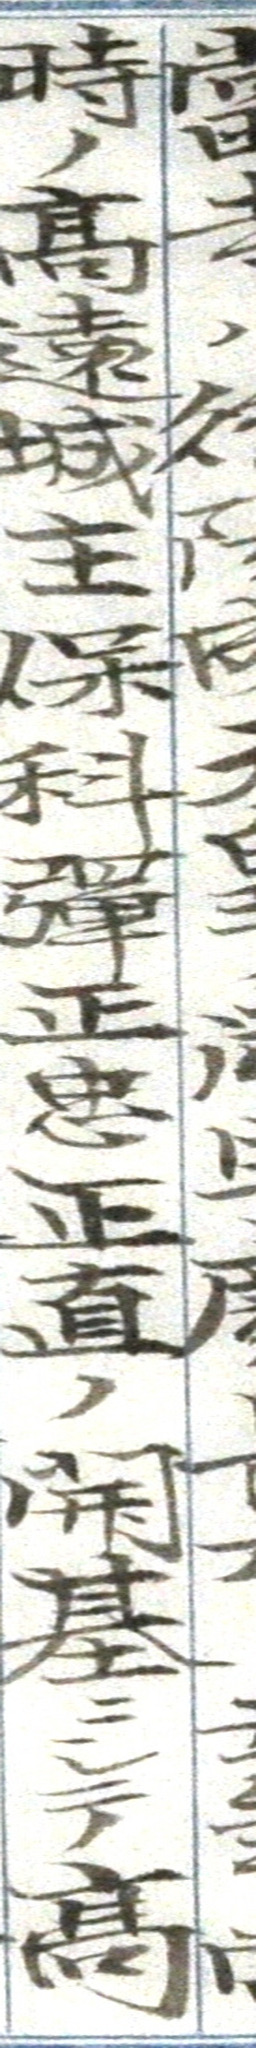時ノ高遠城主保科弾正忠正直ノ開基ニシテ高
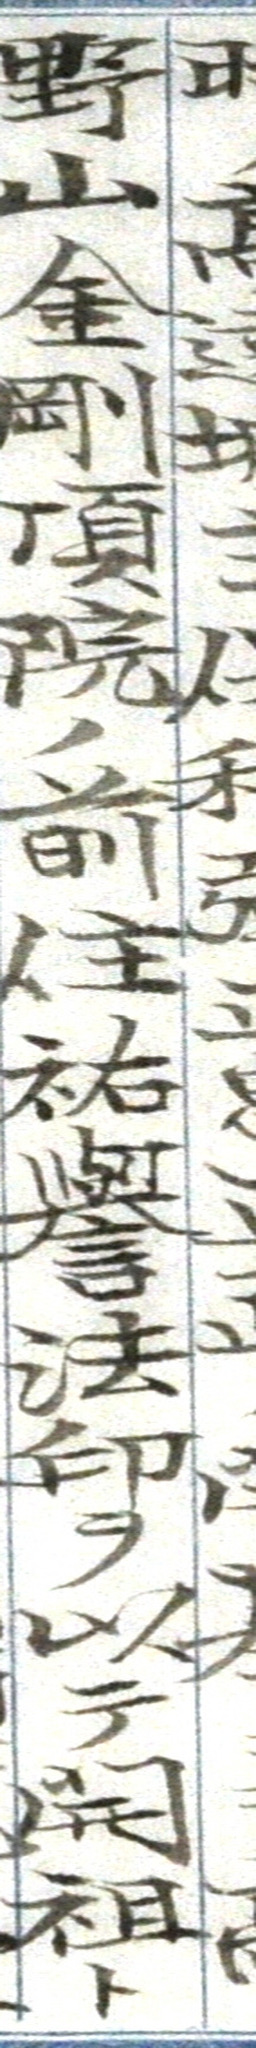野山金剛頂院ノ前住祐誉法印ヲ以テ開祖ト
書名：桂泉院・樹林寺・東光寺縁起書、蓮華寺由来書、付夕顔観音記
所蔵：伊那市立高遠町図書館・合同会社AMANE
